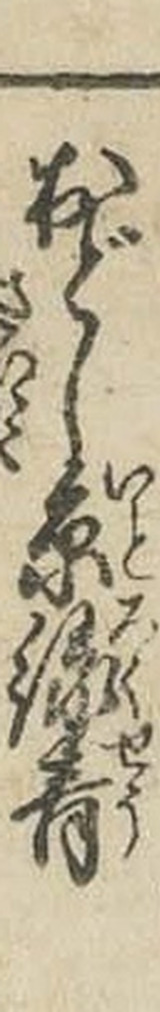おどし糸緑青
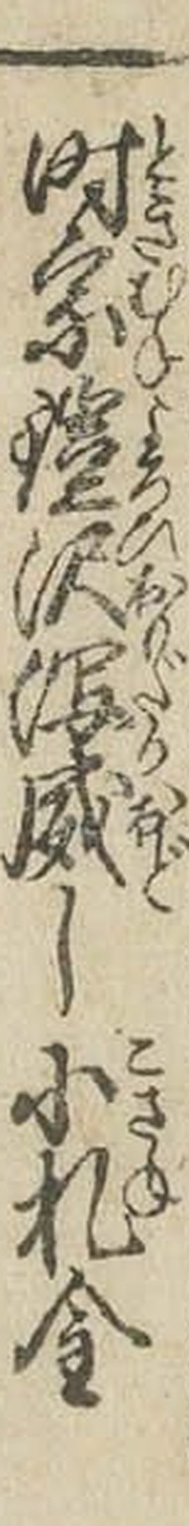時宗鎧沢潟威し小札金
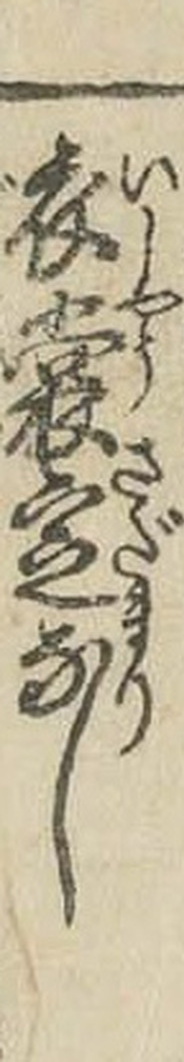衣裳定なし
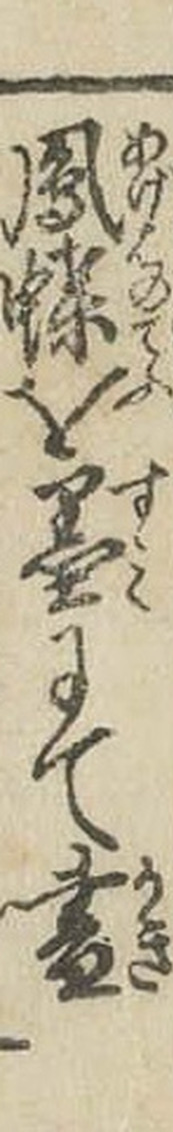鳳蝶を墨にて書
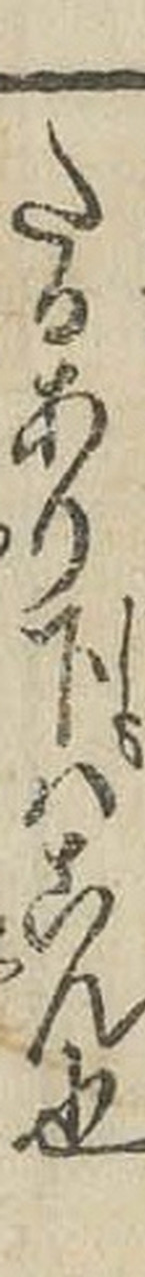たるあり下はこん也
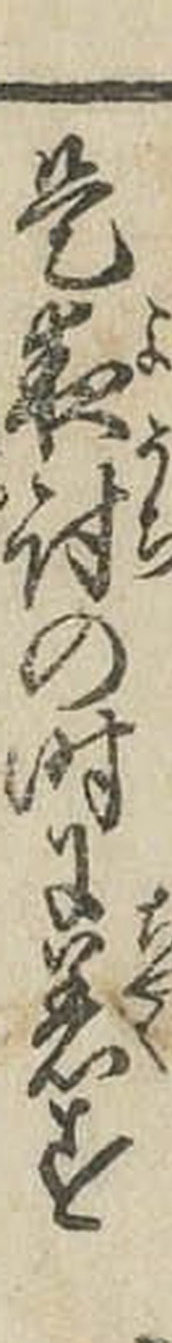是夜討の時に着す
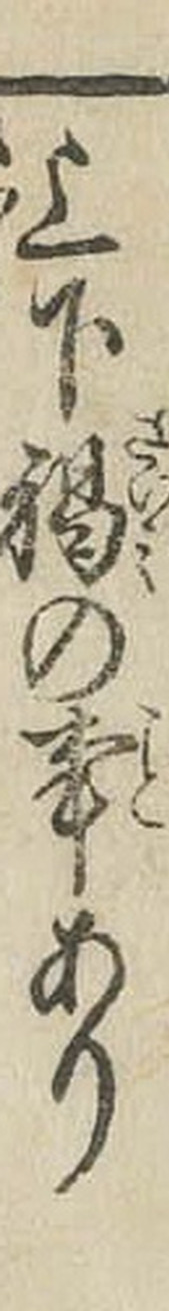上下褐の事あり
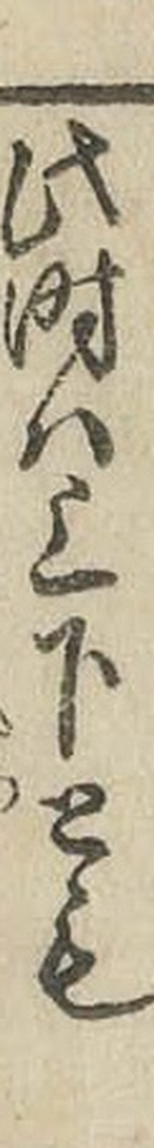此時は上下とも
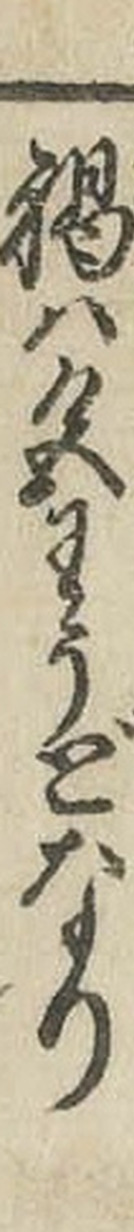褐は色わうどなり
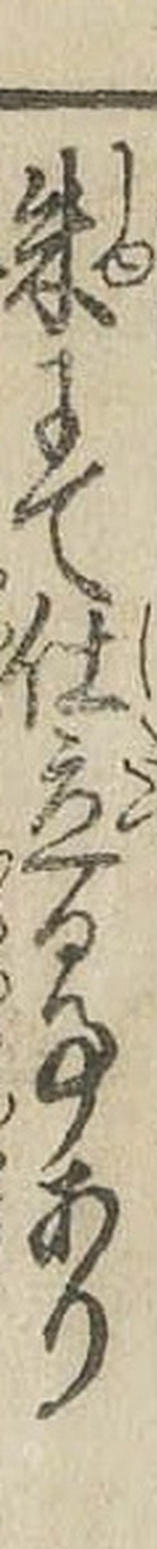朱にて仕立る事あり
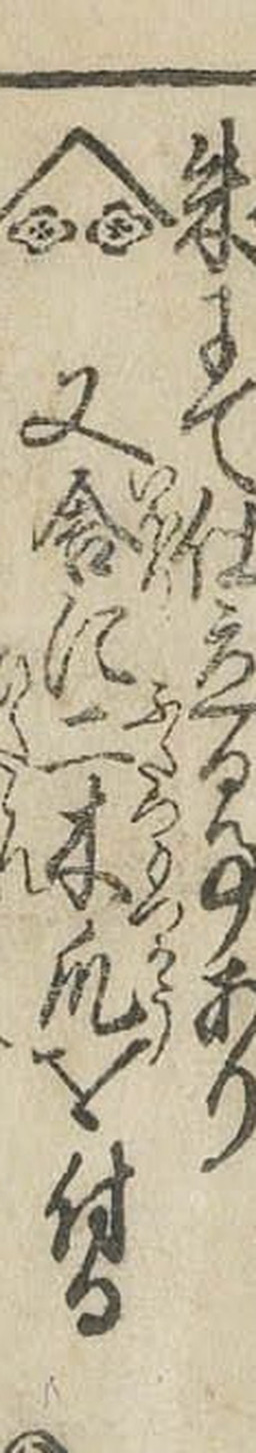又舎に二木瓜を付る
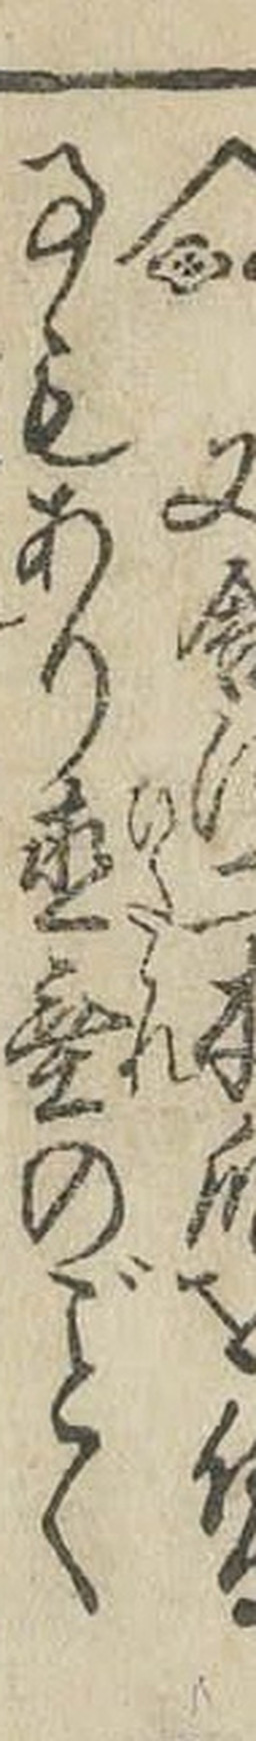事もあり直垂のごとく
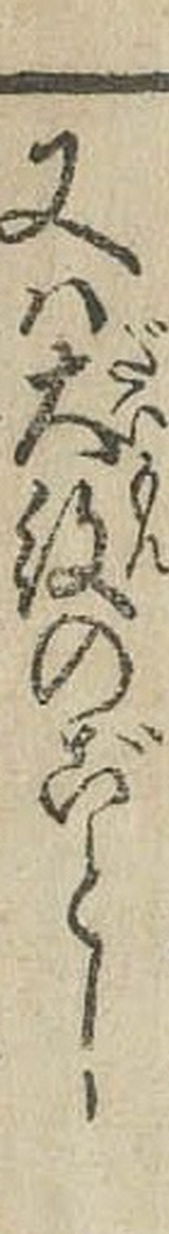又は大紋のごとし
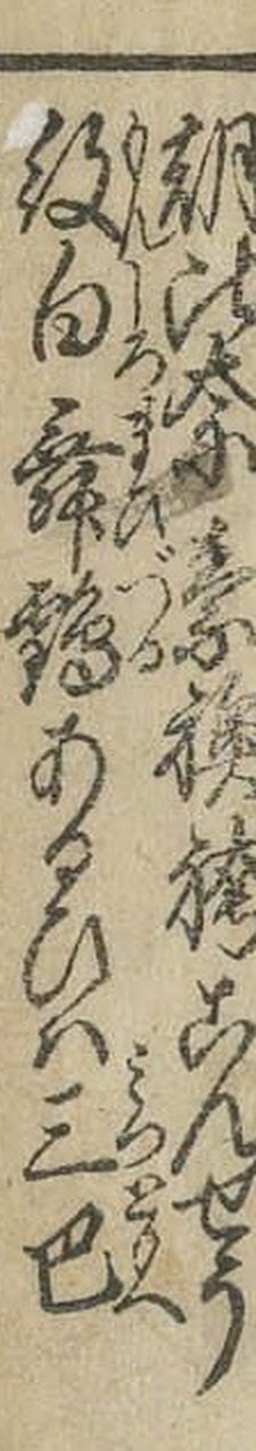紋白舞鶴あるひは三巴
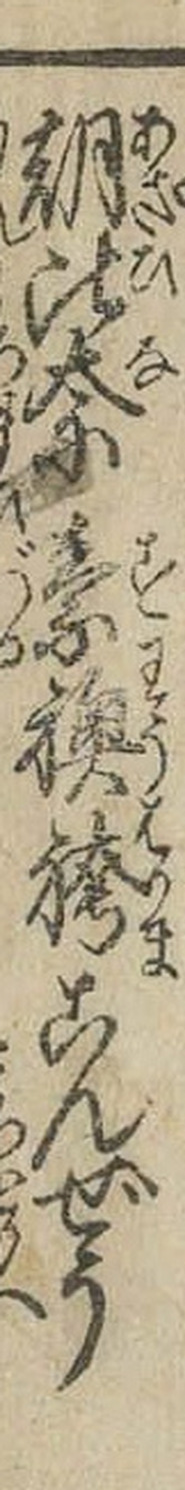朝比奈素襖袴こんぜう

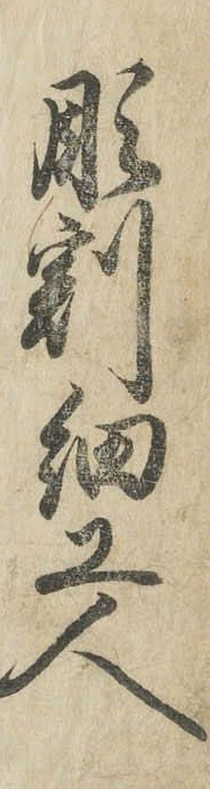彫割細工人
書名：絵本写宝袋 9巻 3之巻
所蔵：東京学芸大学教育コンテンツアーカイブ
